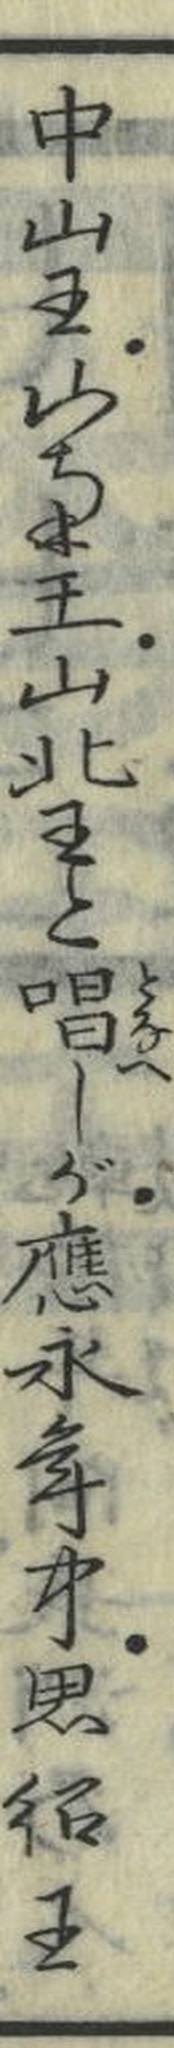中山王・山南王・山北王と唱しが應永年中・思紹王
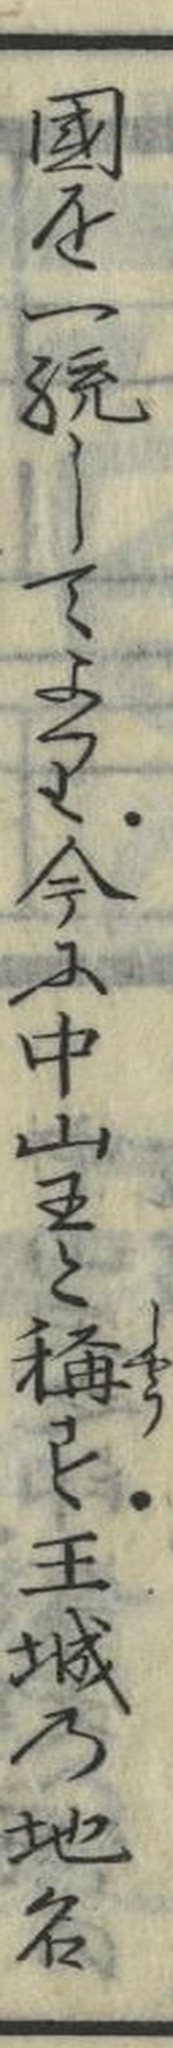國を一統してより・今に中山王と稱す・王城の地名
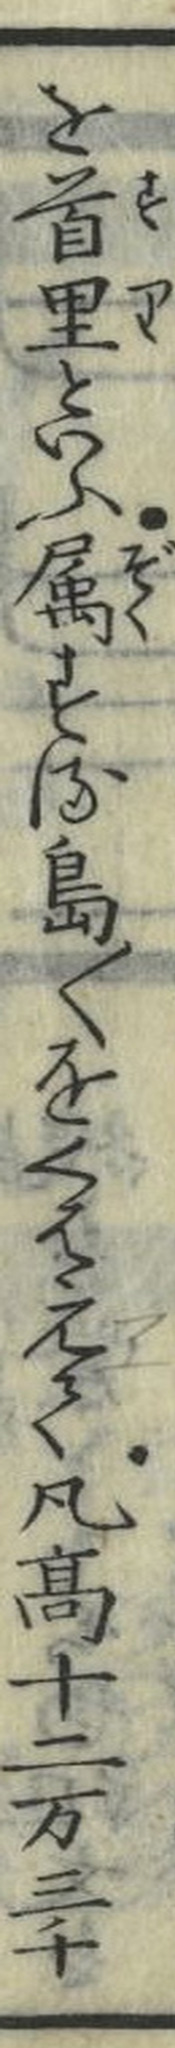を首里といふ・属する島〳〵をくはえて・凡高十二万三千
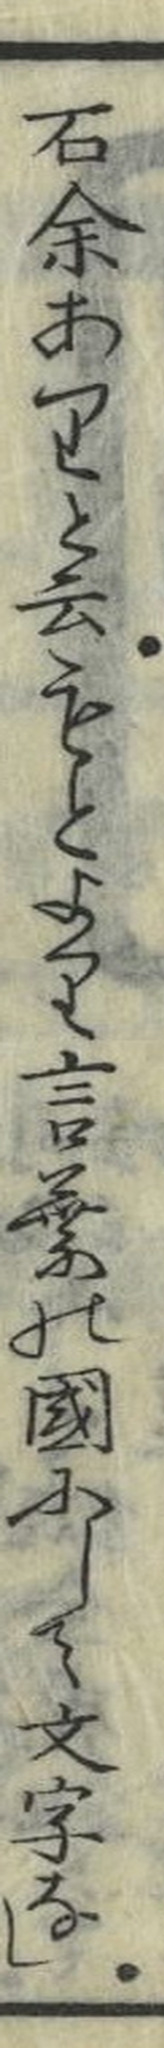石余ありと云・もとより言葉の國にして文字なし・
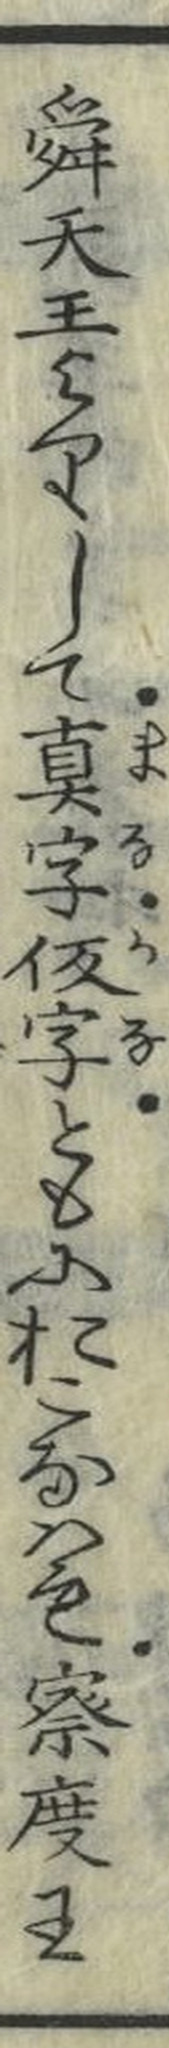舜天王のよりして・真字・仮字・ともにおこなはれ・察度王
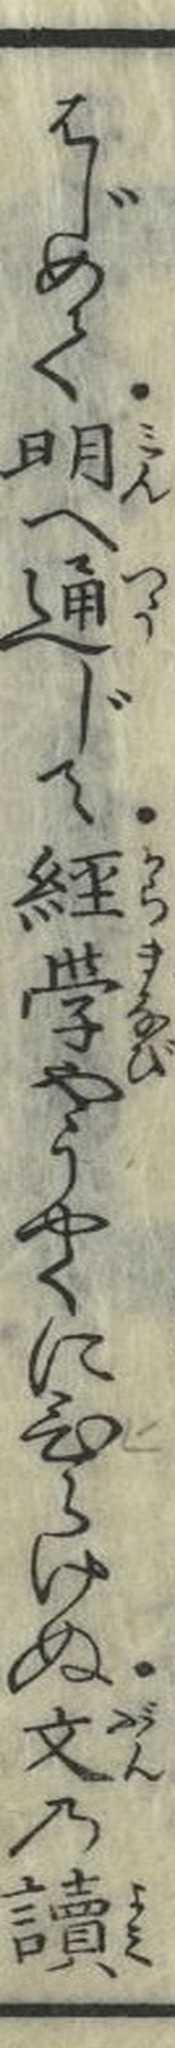はじめて・明へ通じて・經學やうやくにひらけぬ・文の讀
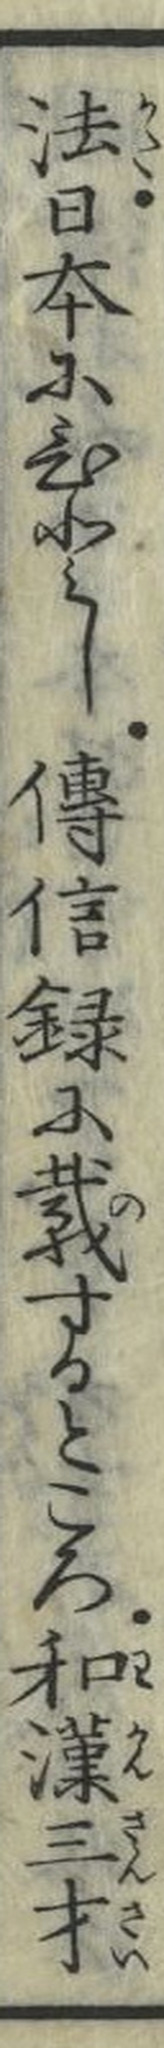法・日本にひとし・傳信錄に載するところ・和漢三才

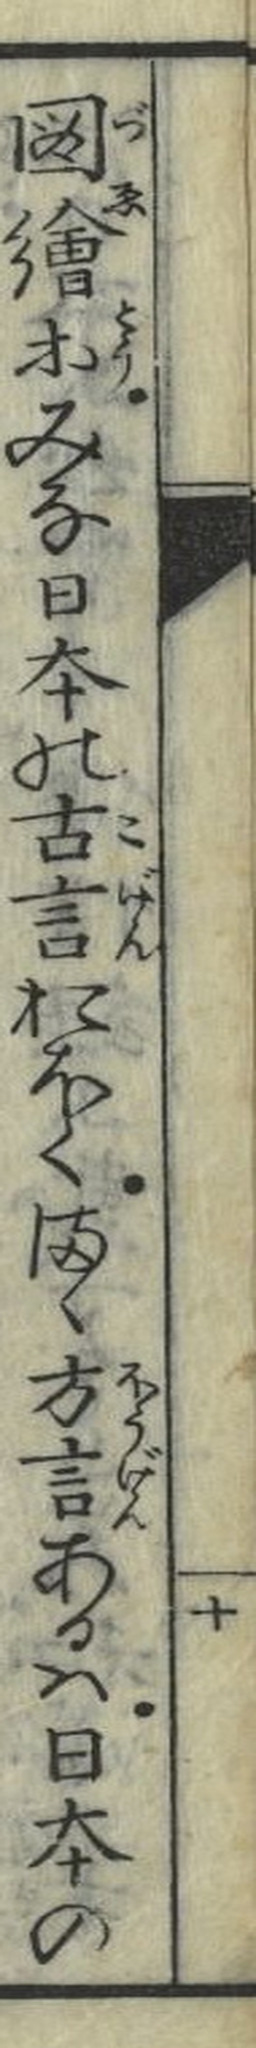図繪等・みな日本の古言おほく・まゝ方言あるは・日本の
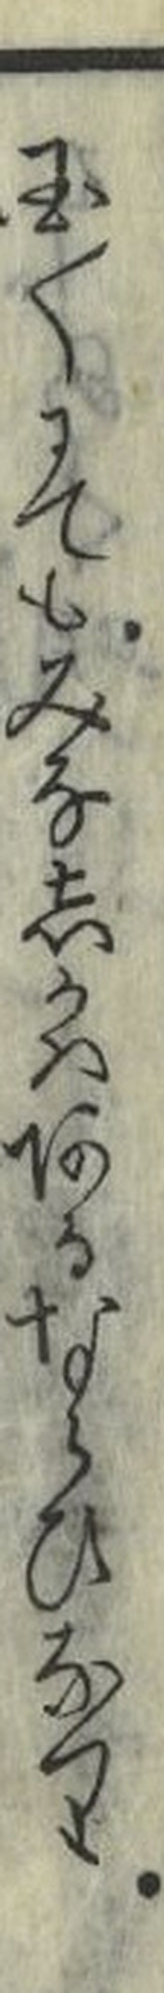国〳〵にても・みなしかはあるならひなり・
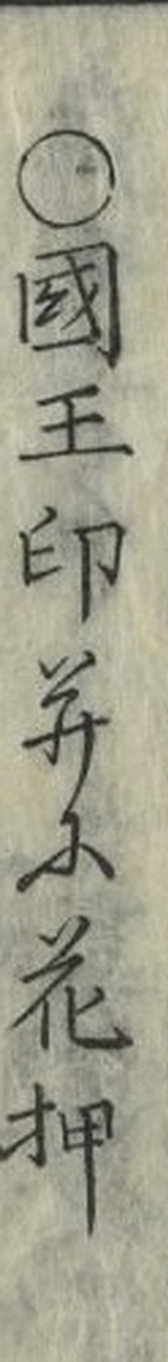〇國王印并に花押
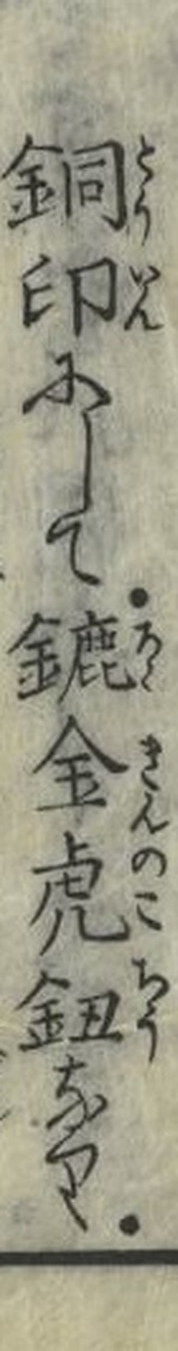銅印にして・鏕金虎鈕なり・
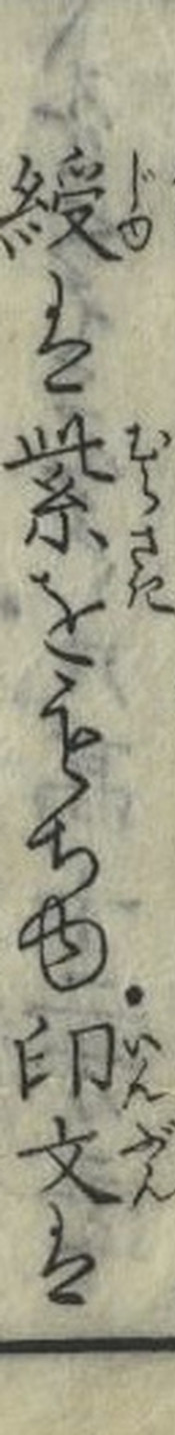綬は紫をもちゆ・印文は
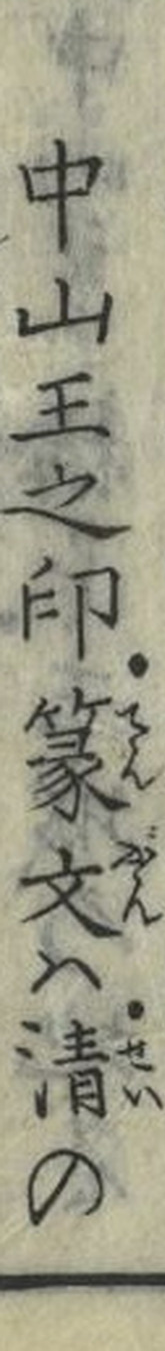中山王之印・篆文は・清の
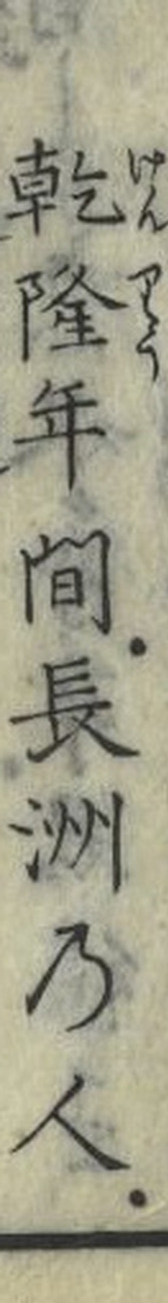乾隆年間・長洲の人・
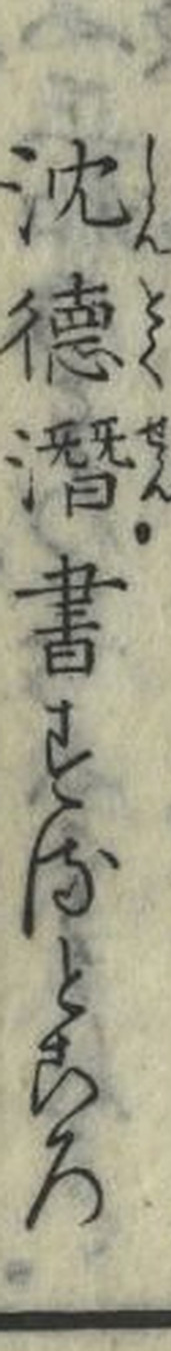沈德潛・書するところ
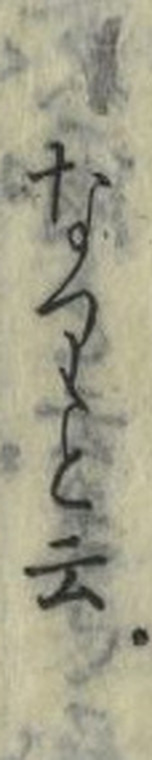なりと云・
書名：琉球秊代記 附雑話 全
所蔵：University of the Ryukyus Library
